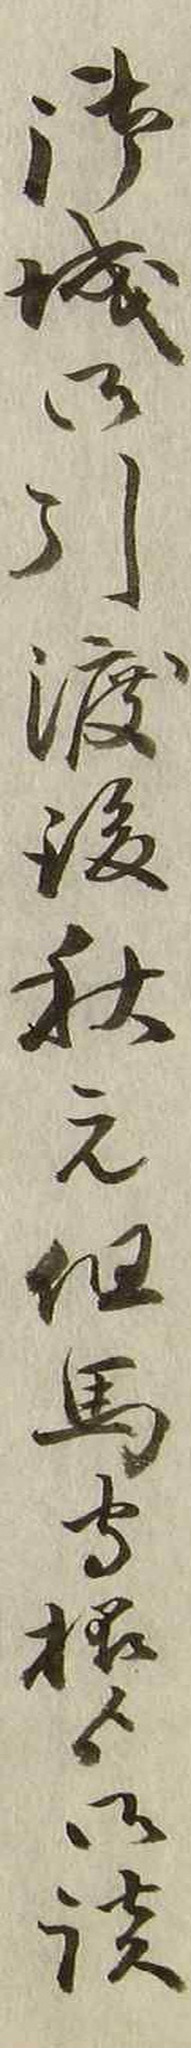御城御引渡後秋元但馬守様ゟ御談
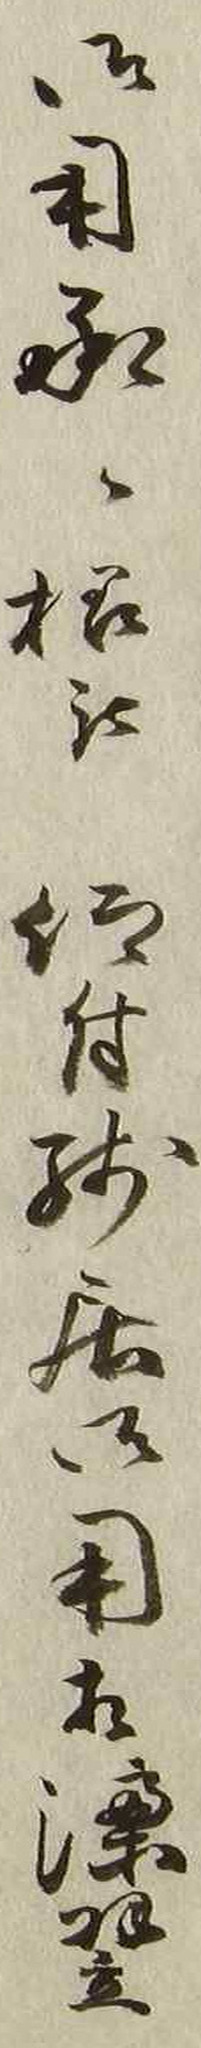御用承候様被仰付残居御用相済翌
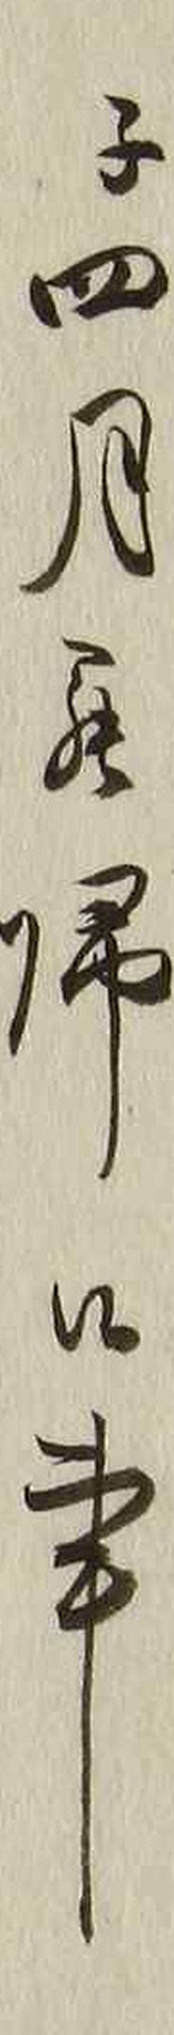子四月罷帰候事
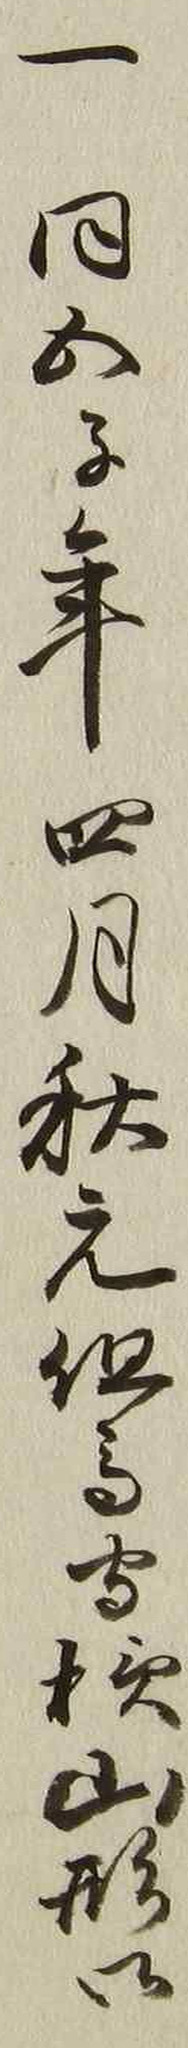一同五子年四月秋元但馬守様山形御
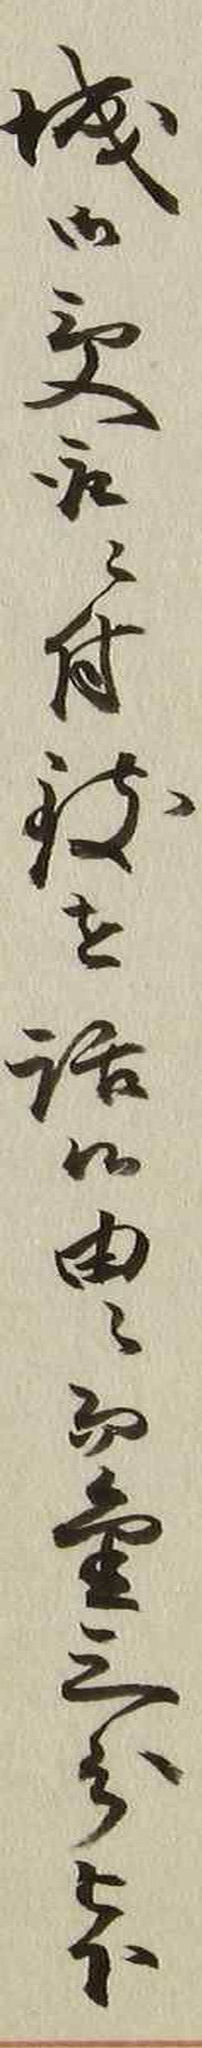城御受取ニ付致世話候由ニ而金三分被下
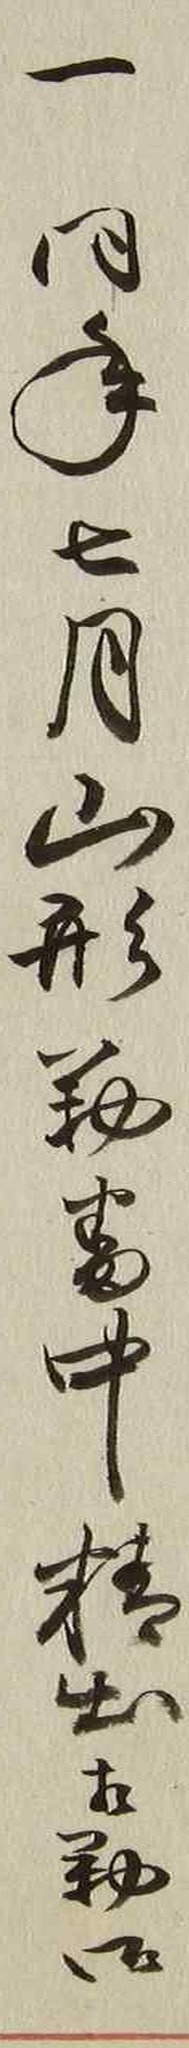一同年七月山形勤番中精出相勤御
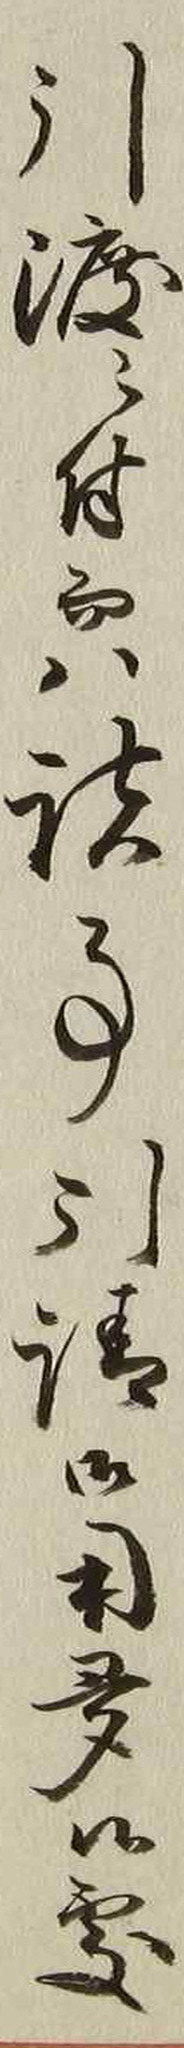引渡ニ付而ハ諸事引請御用多候処
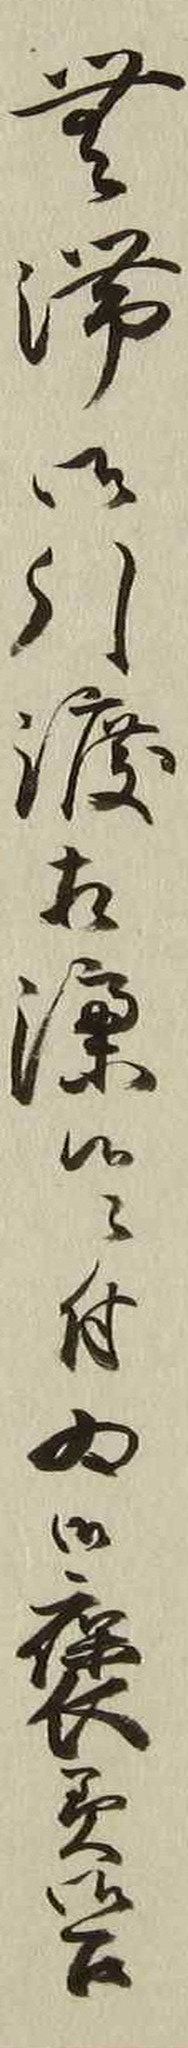無滞御引渡相済候ニ付為褒御美御召
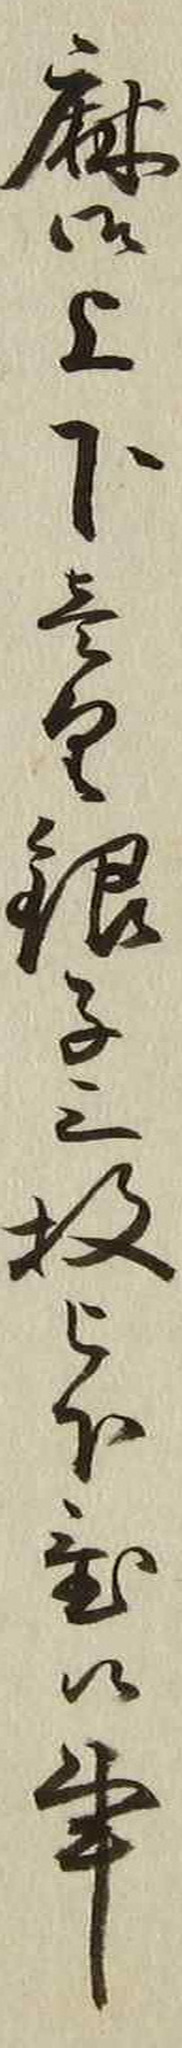麻御上下壱具銀子三枚被下置候事
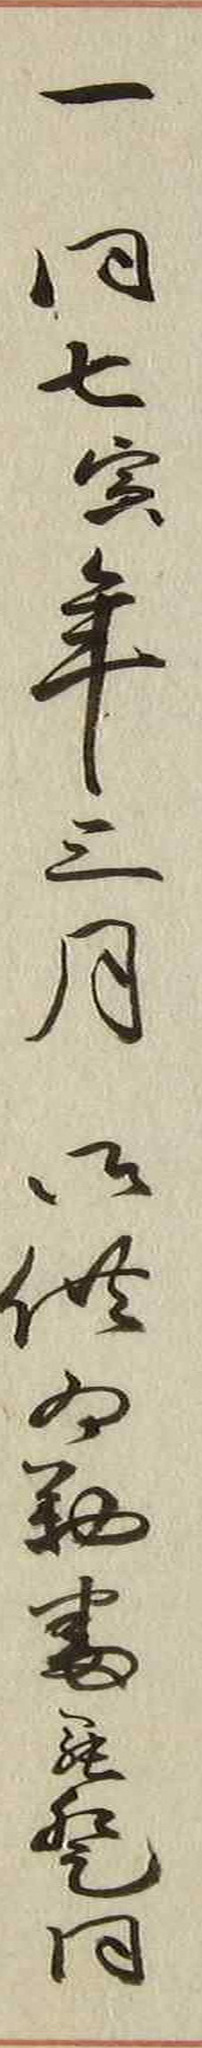一同七寅年三月御供為勤番罷登同
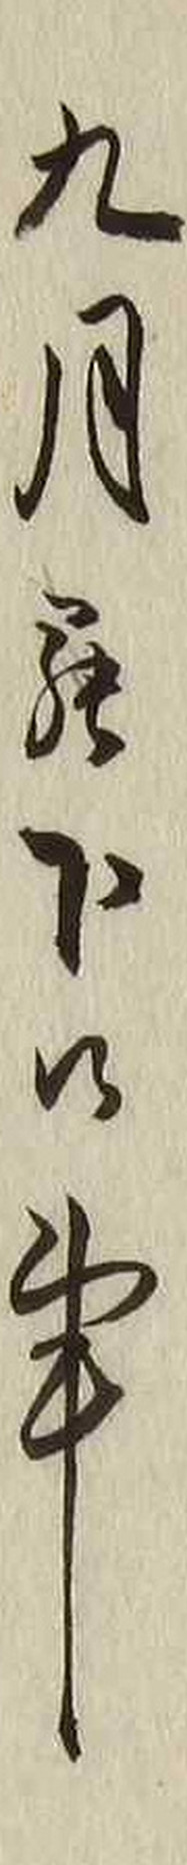九月罷下候事
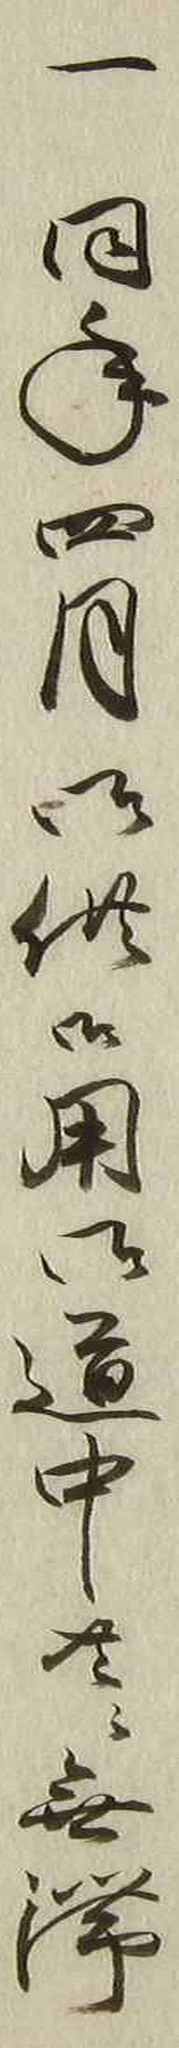一同年四月御供御用御道中共ニ無滞
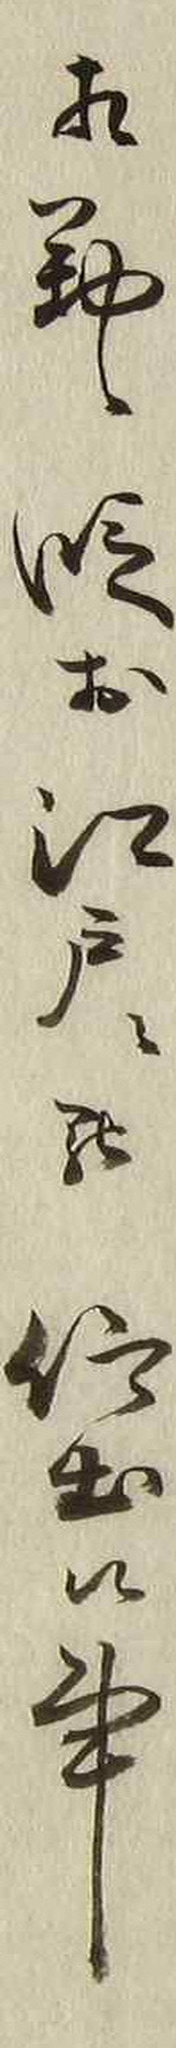相勤候段於江戸ニ被仰出候事
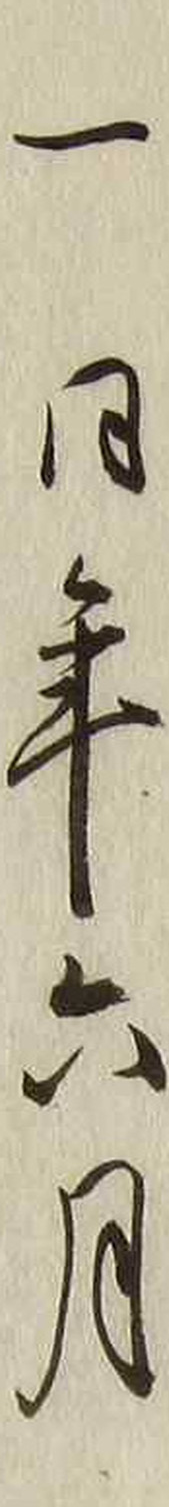一同年六月
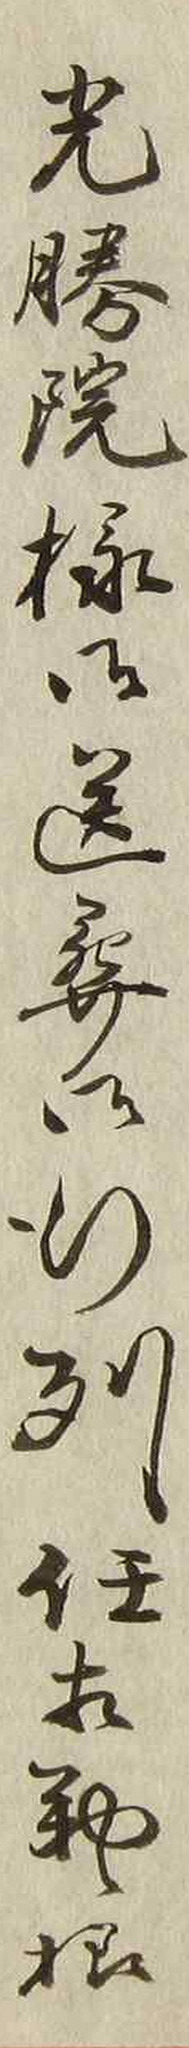光勝院様御送葬御行列任相勤候様
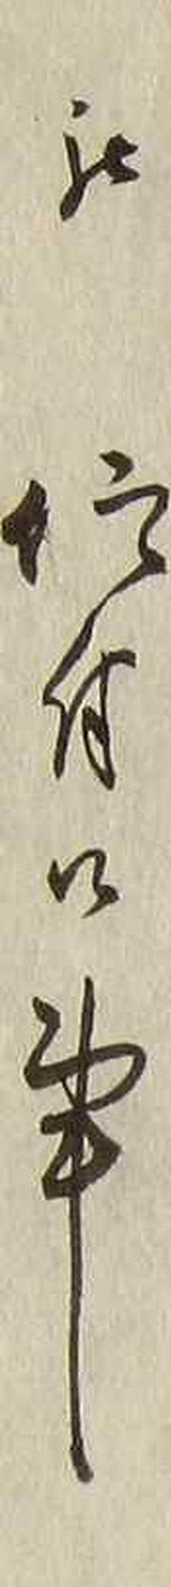被仰付候事
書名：諸士系譜　巻之15　い之部15
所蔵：会津若松市立会津図書館
